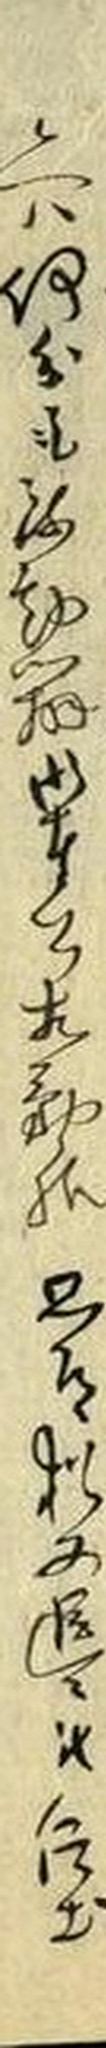候へハ何分も致勘弁御奉公相勤候様思召候猶又追々被仰出
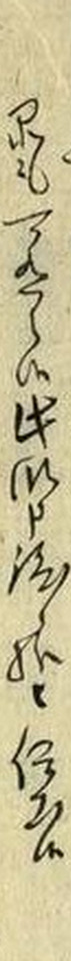品も可有之候此段申渡候様被仰出候
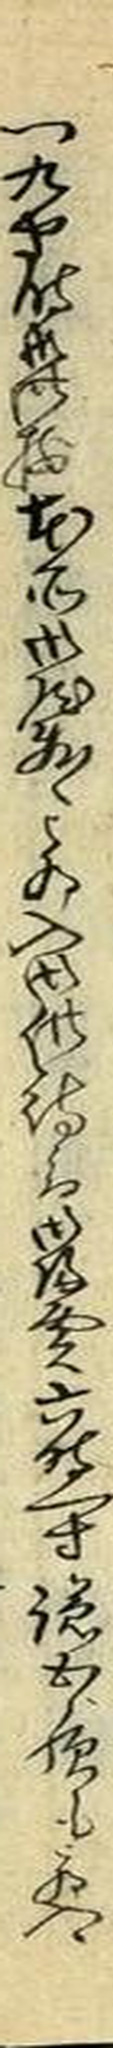一九半時御供揃本所御屋敷へ被為入御供待ニ而御帰殿六時一寸謙五郎様も被為入候
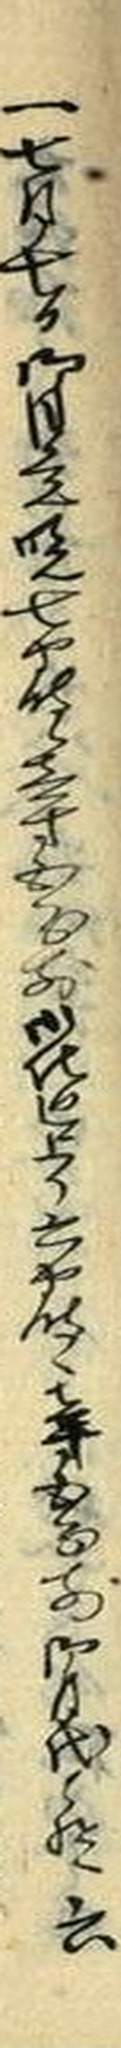一七月七日御目覚暁七半時壱寸五分前御仕廻上り六半時へ壱寸五分前御月代被遊候六
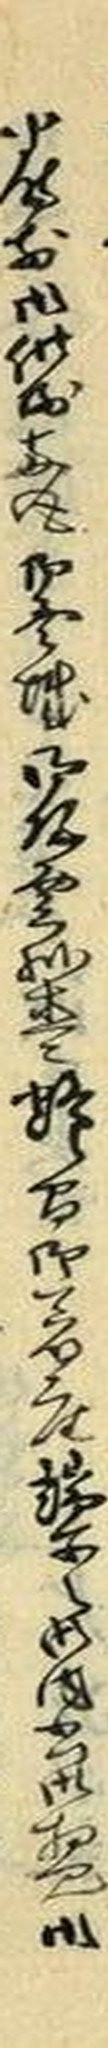半時前御供揃両丸御登城御帰殿掛直々鶴之間御着座端午之御内書御拝見御
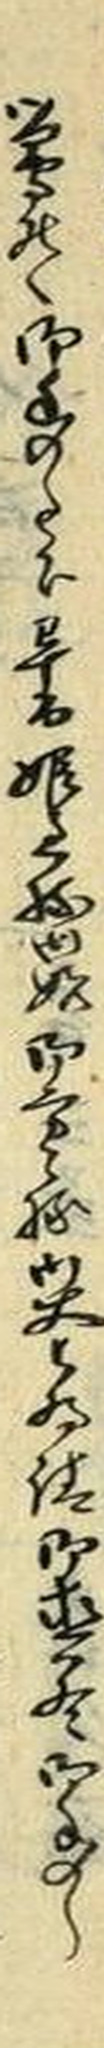留守居へ御手のし被下畢而姫君様御始御方々様御使被為請御直々各御手のし
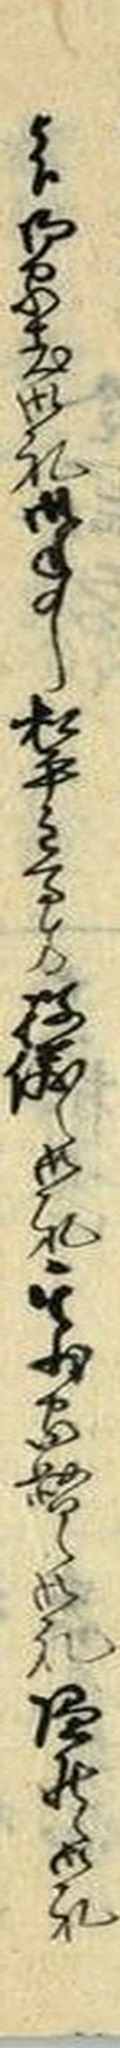被下御家老御礼御手のし松平主馬方役儀之御礼其外家督之御礼隠居之御礼
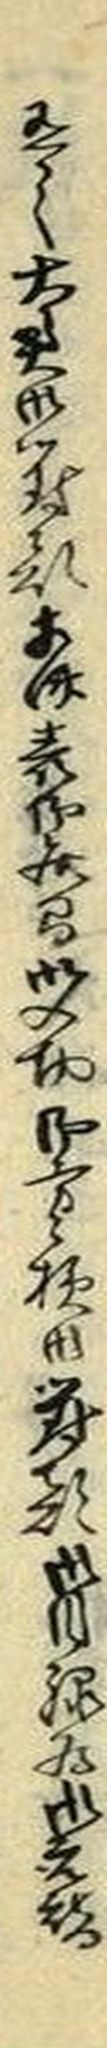有之大奥御対顔相済表御居間御〆切御方々様御対顔御目録為御取替
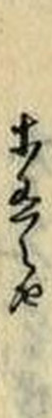等有之由
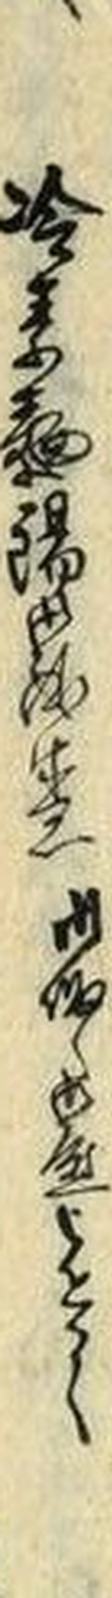姫君様へ冷素麺錫御鉢盛御側御慰被進之
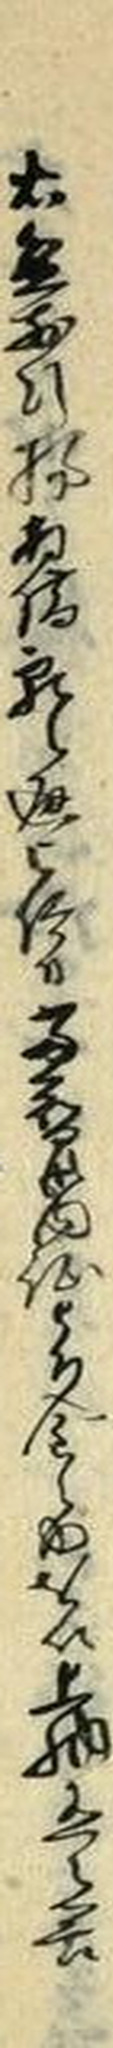右盆前引揚拝借願之通被仰付当暮御内証被下金之内を以上納有之筈
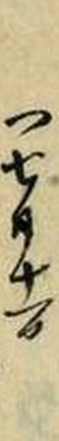一七月十一日
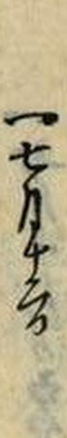一七月十一日

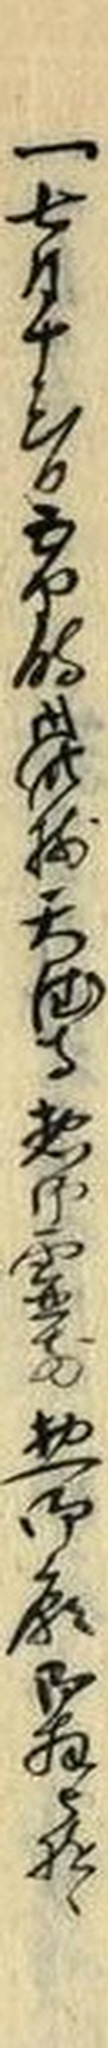一七月十三日五半時御供揃天徳寺惣御霊前惣御廟御拝被遊候
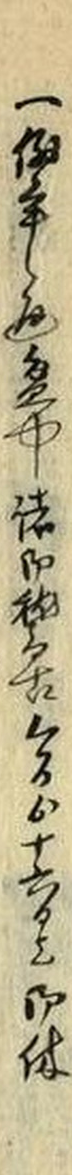一例年之通盆中諸御稽古今日ゟ十六日迄御休
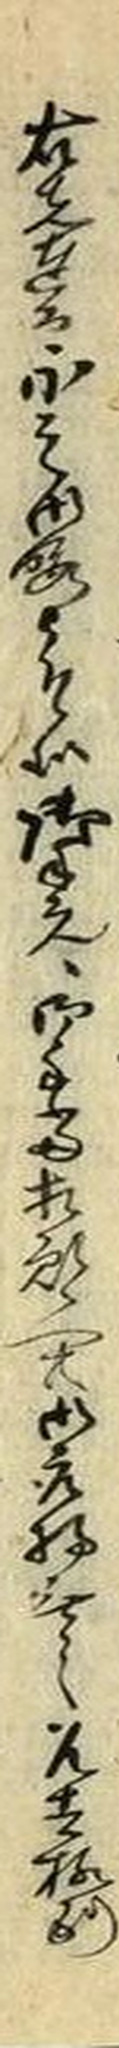右先達而永々御暇被下候処御手元へ御手当相願候へ共御取持無之取立格別
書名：少傅日録抄（斉承付側向頭取日記、在府）
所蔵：福井県文書館 Fukui Prefectural Archives
